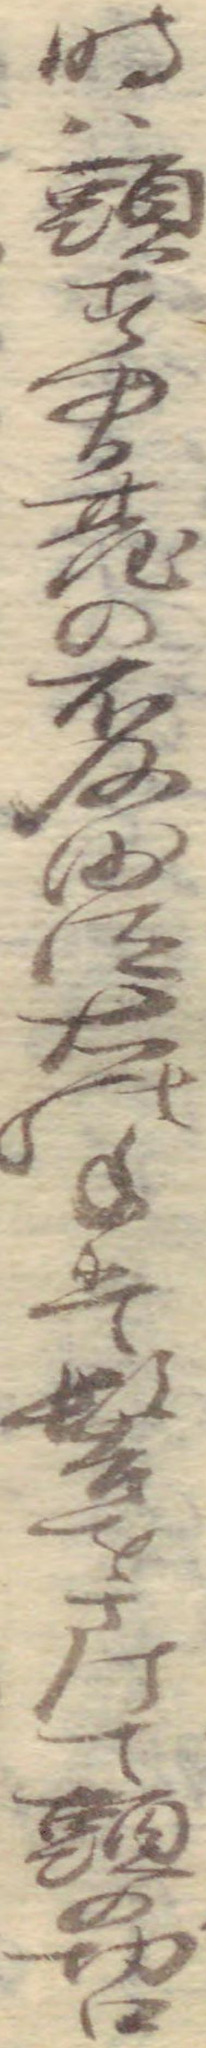時ハ頭すゆる䑓の不及沙汰右の手にて髻をさけて頭の切口
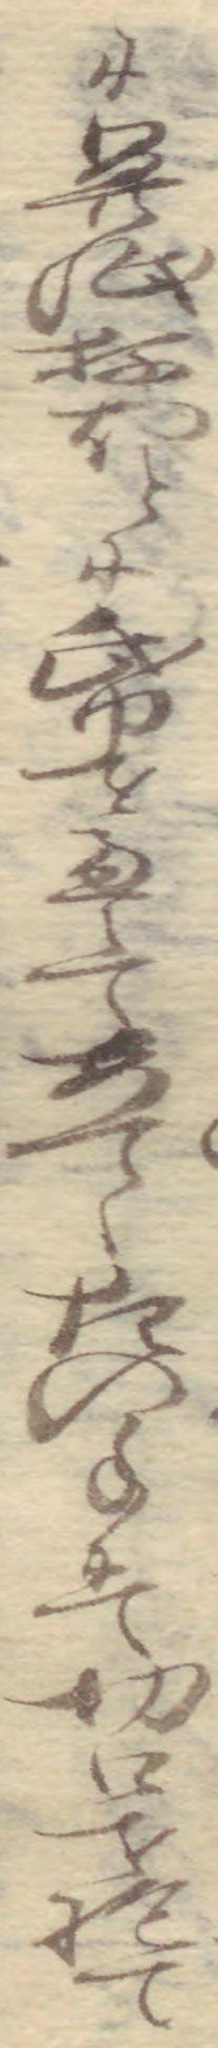に鼻紙抔ほとに帋を畳てあてゝ左の手にて切口を抱て
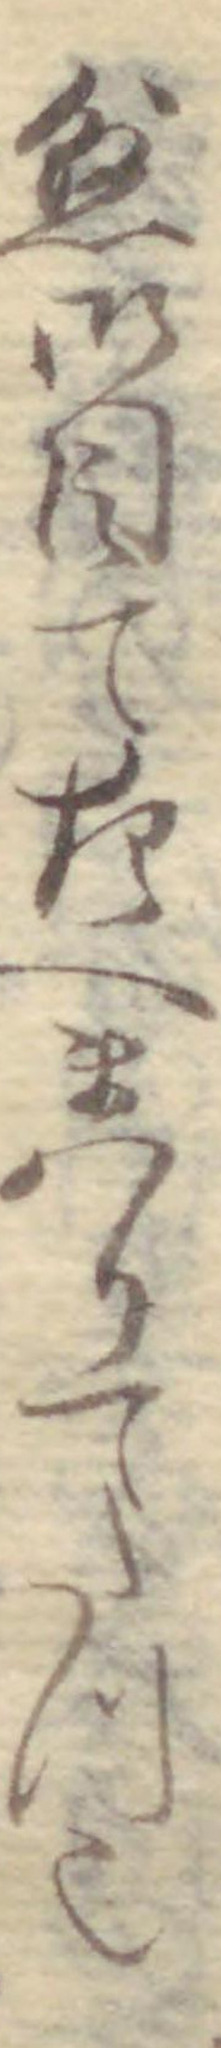懸御目て左へまハりてたつ也
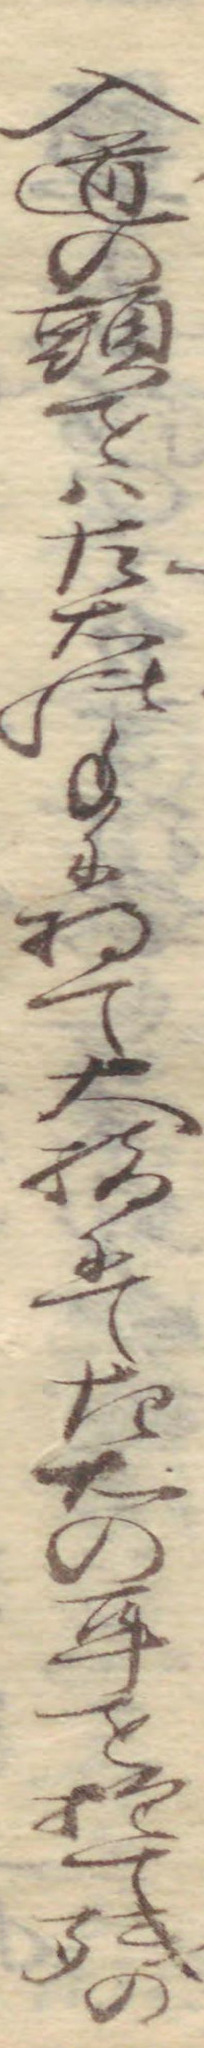一入道の頭をハ左右の手に持て大指にて左右の耳を抱て残の
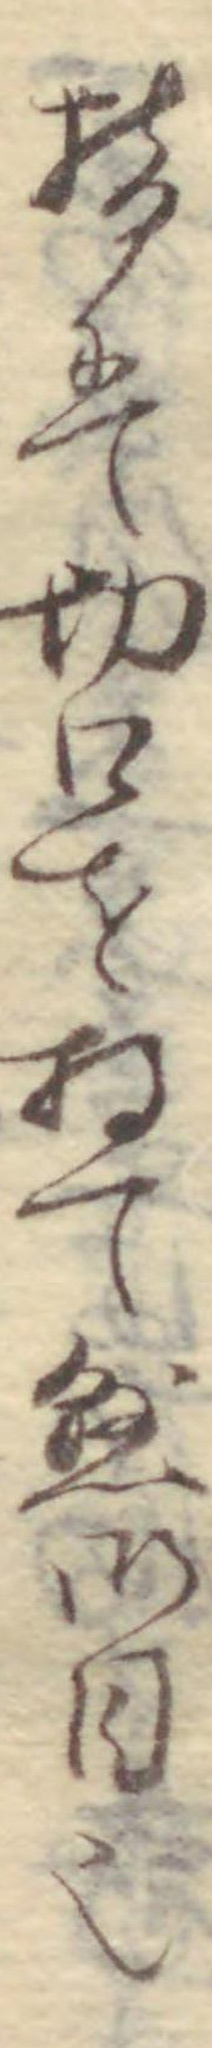指にて切口を持て懸御目也
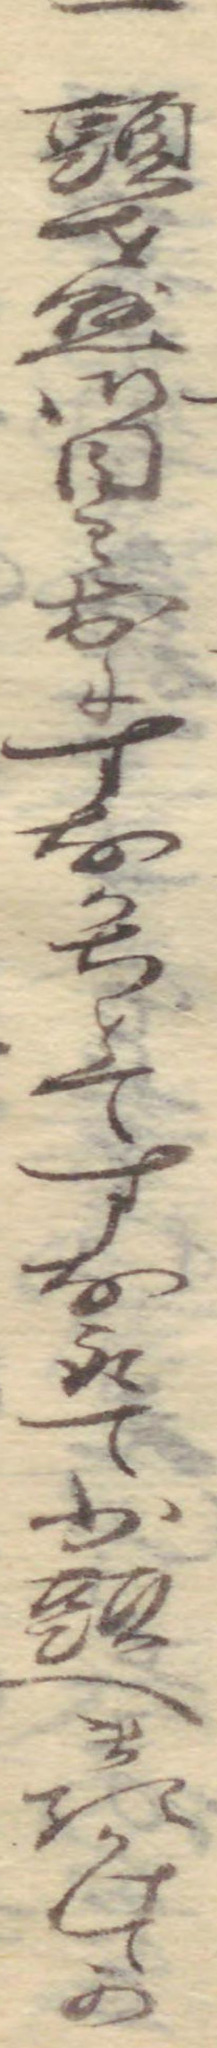一頭を懸御目已前にすなかちとてすな取て少頭へまきかけて可
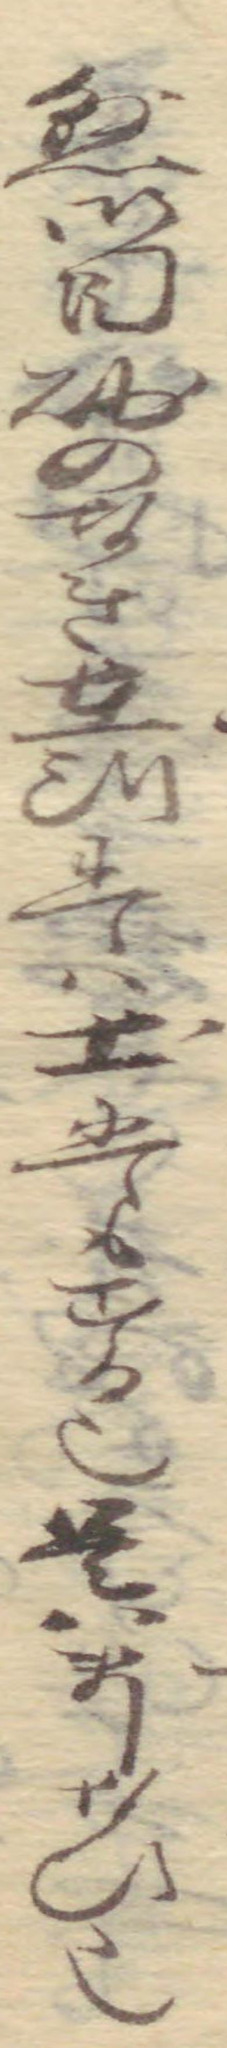懸御目砂のなき在所にてハ土にてもする也是ハましなひ也
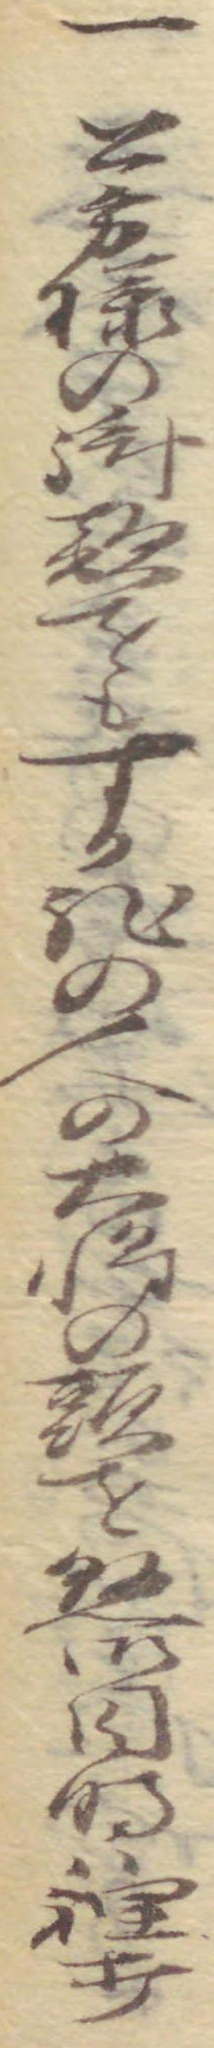一公方様の御敵をもする程の人の大将の頭を懸御目時ハ裡打
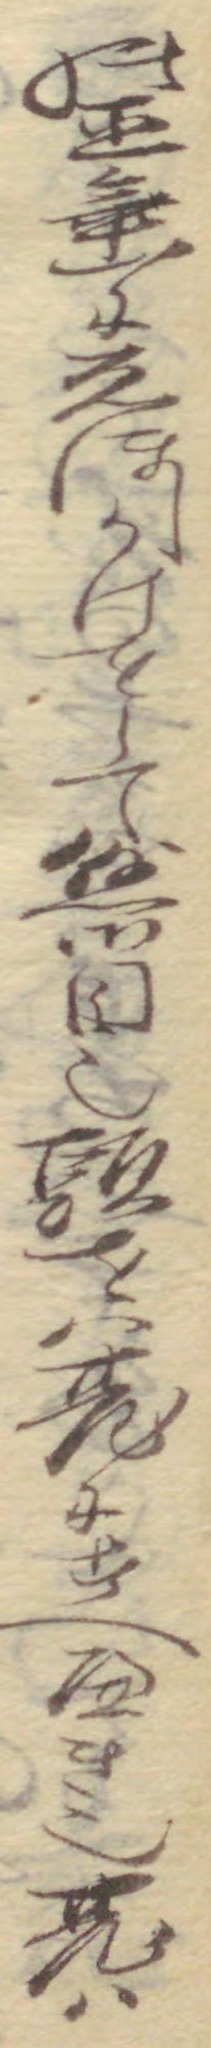の直垂にゑほしかけをして懸御目也頭をハ䑓にすへへきなり䑓ハ
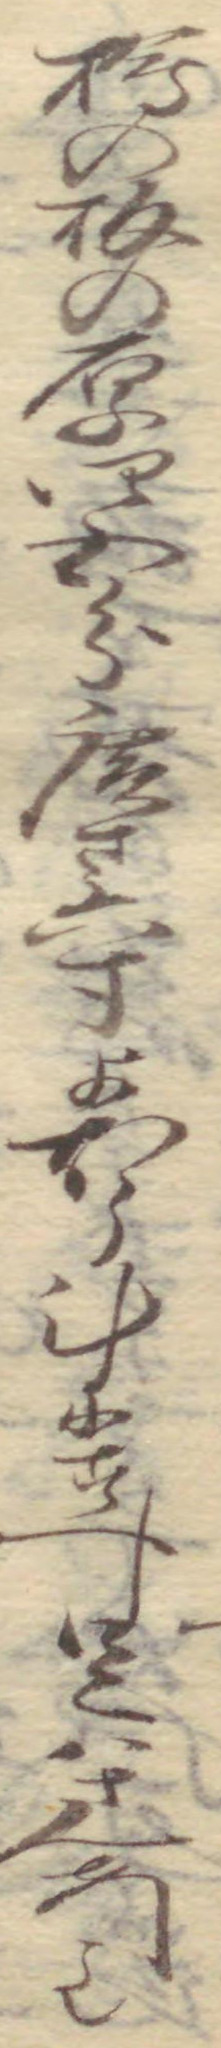檜の板の厚四五分広さ六寸よほう斗にすへし足ハさんあしニて
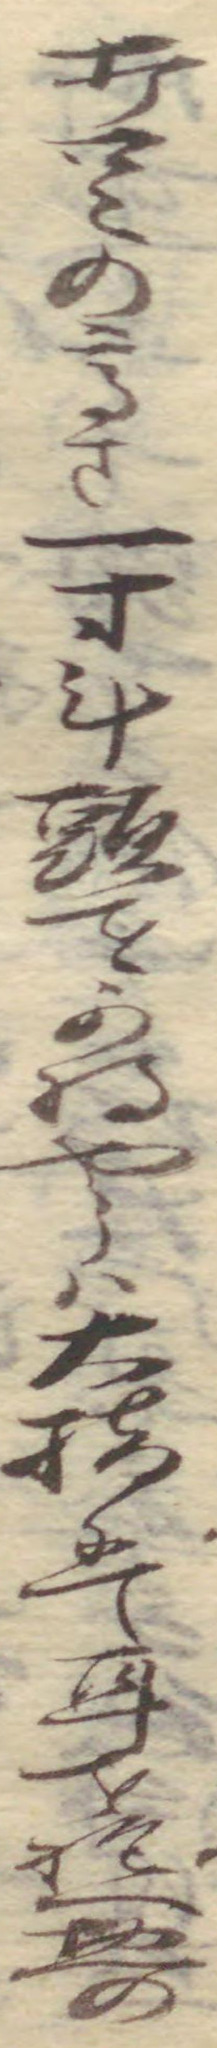打足の高さ一寸斗頭を可持やうハ大指にて耳を抱へ惣の
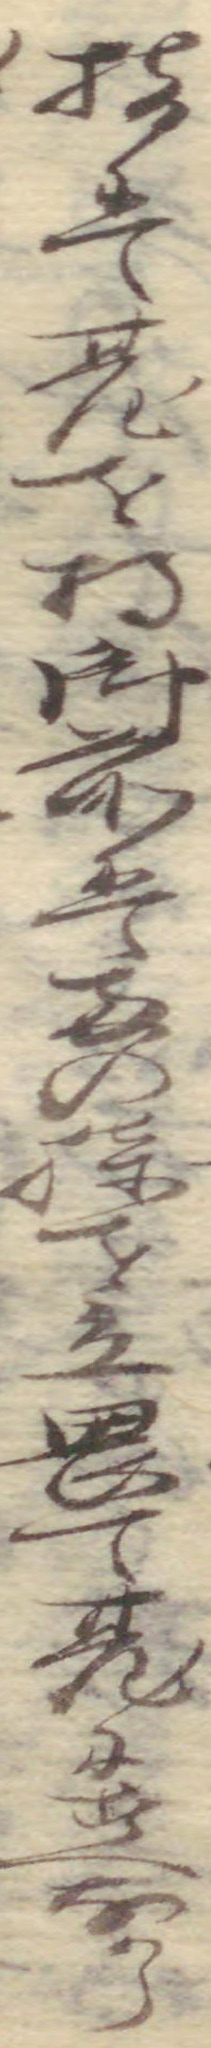指にて䑓を持御前にて両の膝を立畏て䑓にすへなから
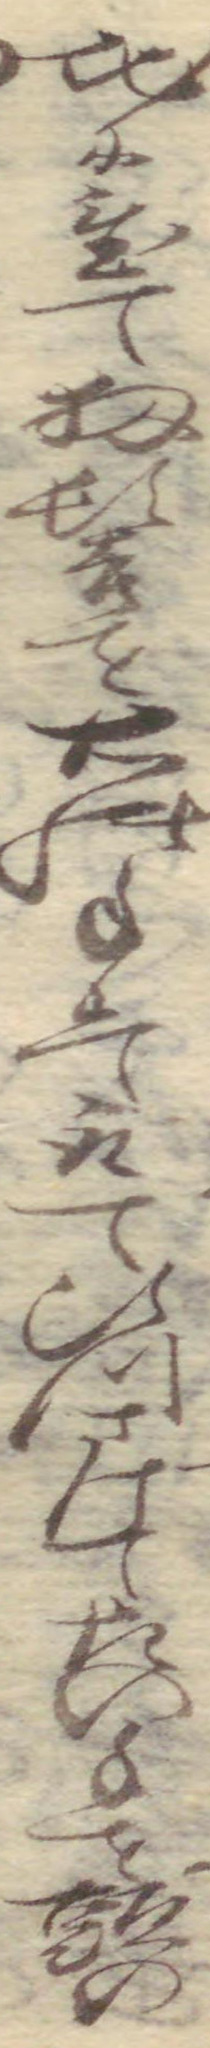地に置て扨髻を右の手にて取てひつさけて左の手を頭の
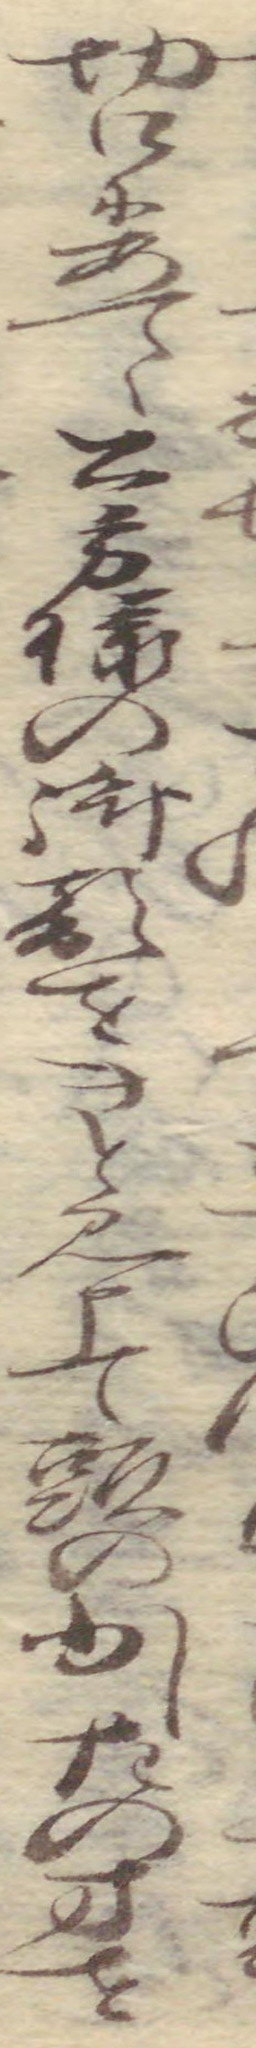切口にあてゝ公方様の御顔をきと見申て頭の少し左の方を
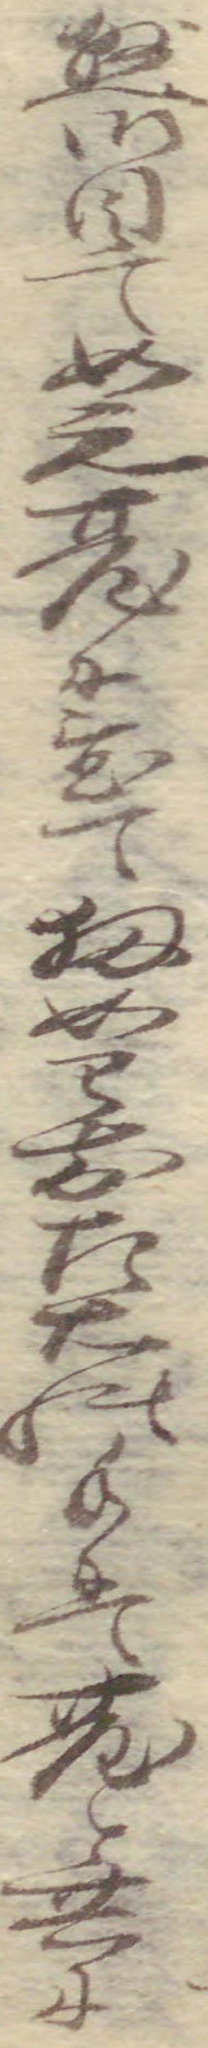懸御目て如元䑓に置て扨如已前左右の手にて䑓と共に
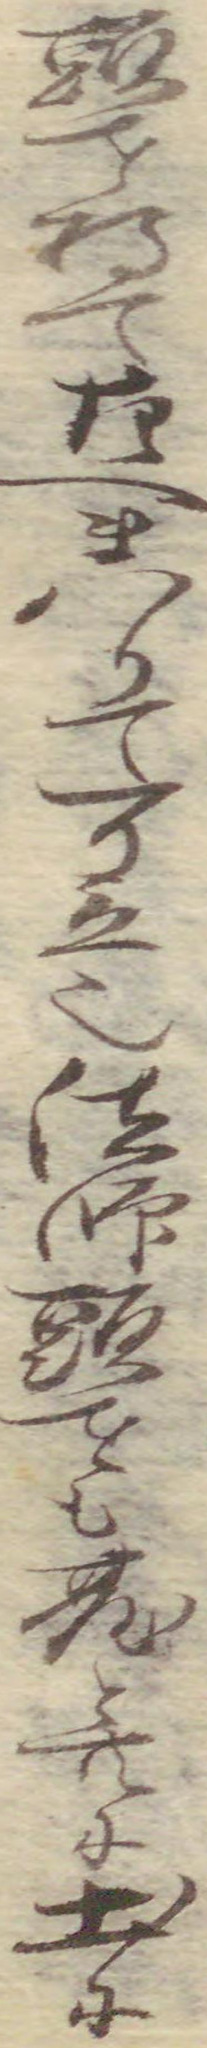頭を持て左へまハりて可立也法師頭をも䑓と共に土に
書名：鶯宿雑記. 巻199-200
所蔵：国立国会図書館 National Diet Library, JAPAN
